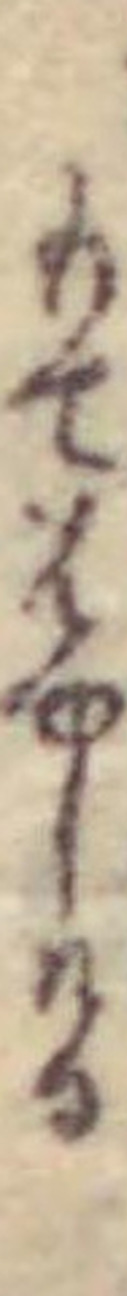もてはやしける
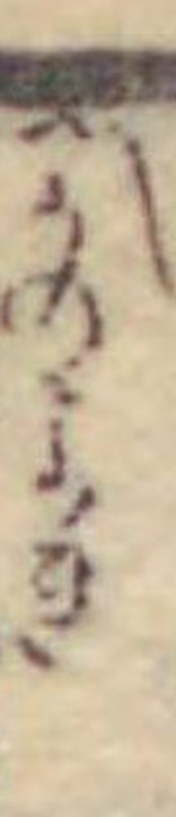〽かのよき
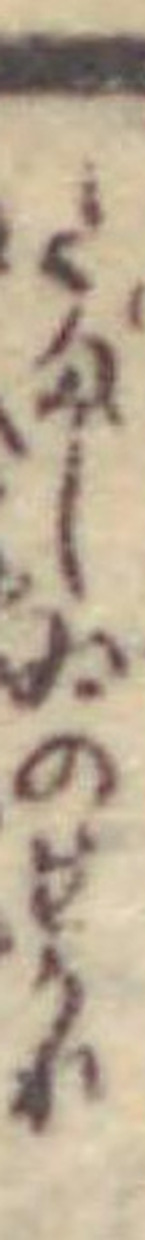たましゐのせかれ
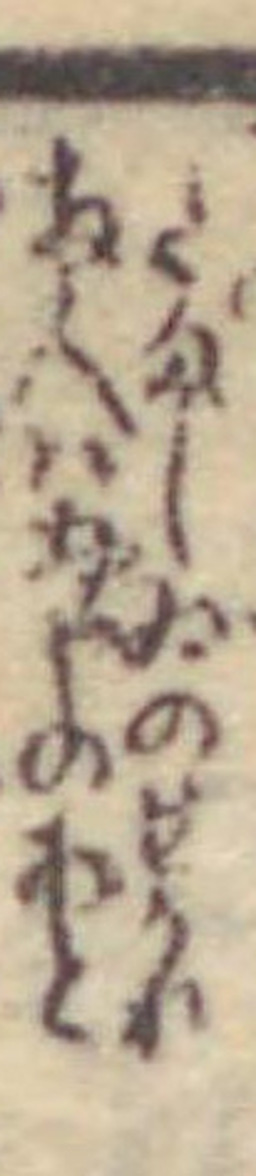両人はおやのあと
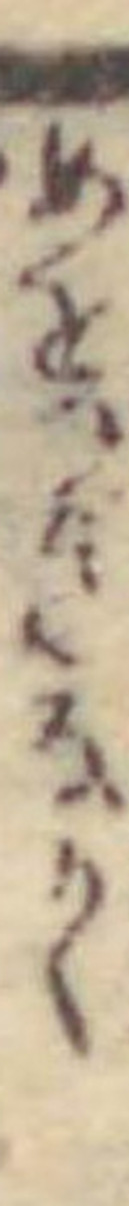めをつきなかく
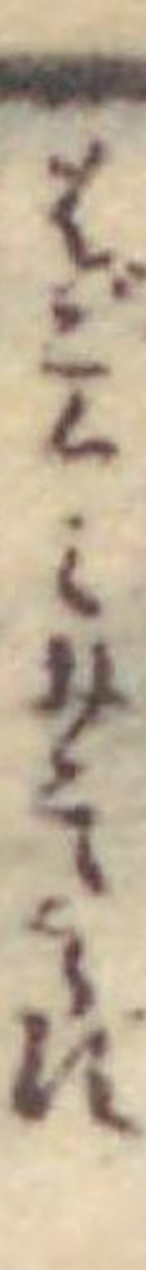はごくみおこたらず
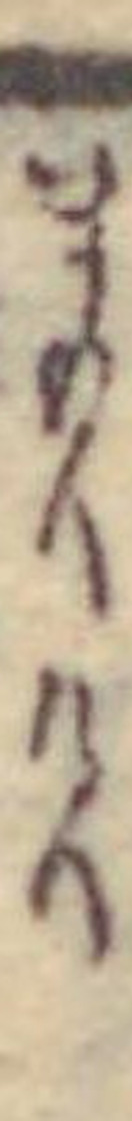まもりけり
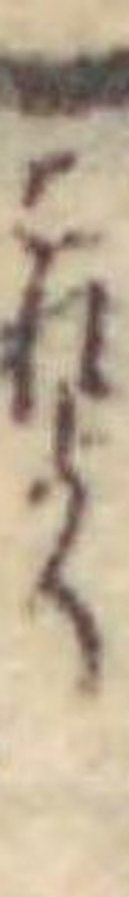これより
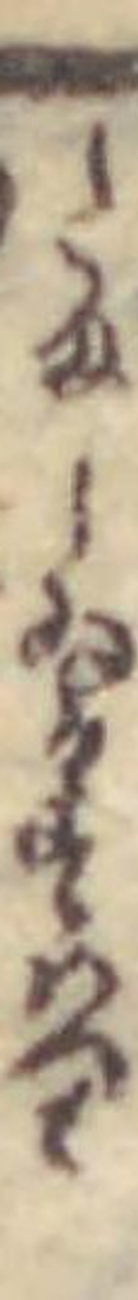たましゐかすはつて
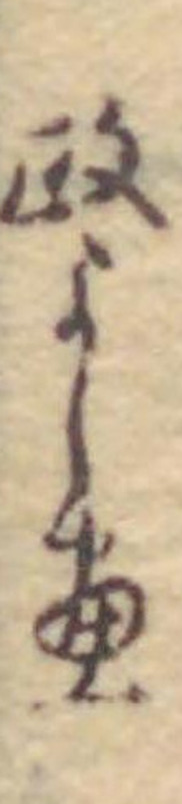政よし画
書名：心学早染艸 : 3巻
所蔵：国立国会図書館 National Diet Library, JAPAN
